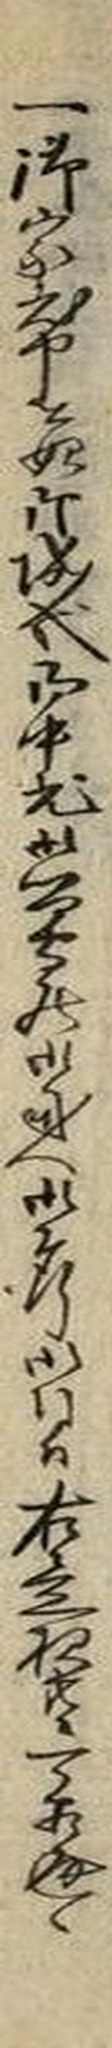一御家老中を始御城代御中老御留守居御用人御奉行御目付右昼夜共に可相通候
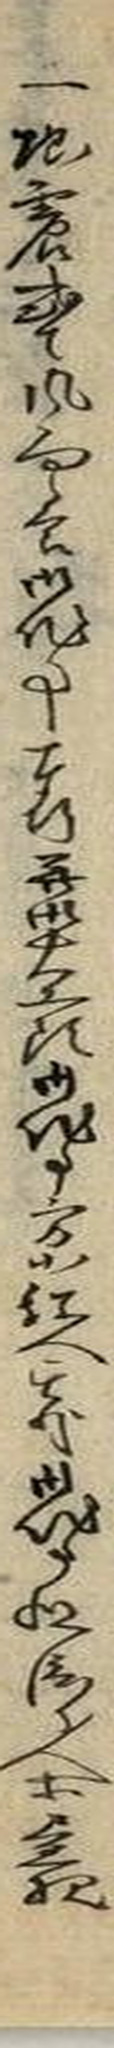一地震或は風雨之節御作事奉行并御大工頭御作事方小役人其外御作事組渡り人等昼夜
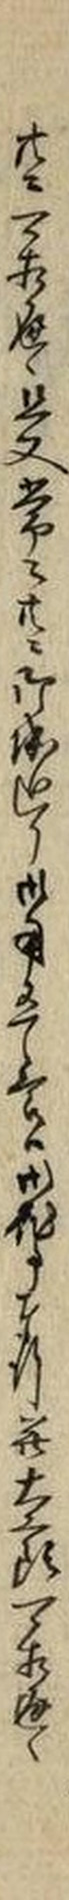共に可相通候且又常々共に御城廻り御用有候節は御作事奉行并大工頭可通相候
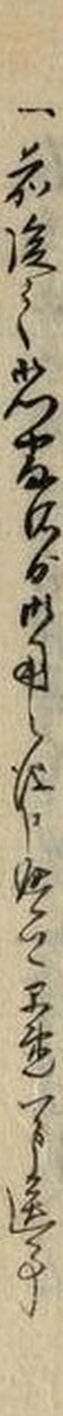一前後之御門番所ゟ御用之儀申通候はゝ早速可申達事
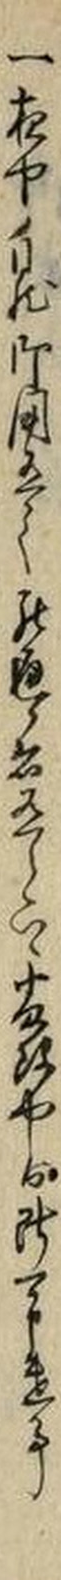一夜中自然御用有之罷通候者有之候はゝ番改中ゟ断可申置候事
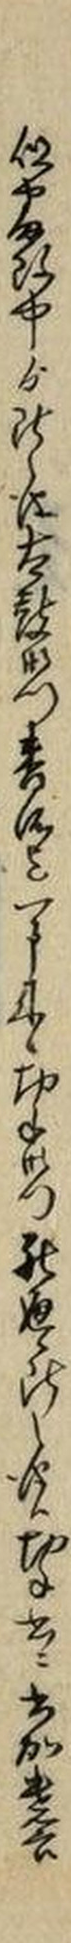但番改中ゟ断候儀太鼓御門番所迄可申来候切手御門罷通候断之儀は切手書に書加遣筈
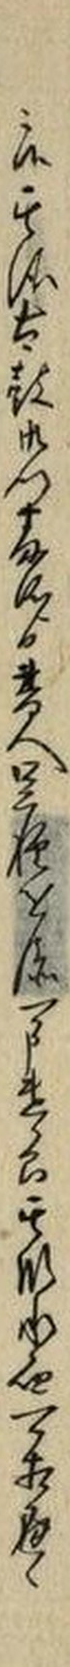に候其趣太鼓御門番所ゟ番人足軽を添可申遣候間其段承届可相通候
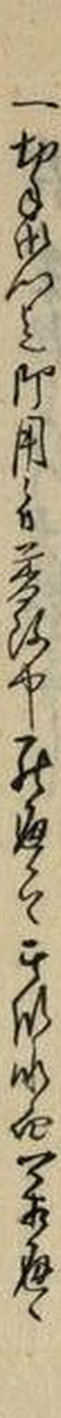一切手御門迄御用に付番改中罷通候はゝ其段承届可相通候
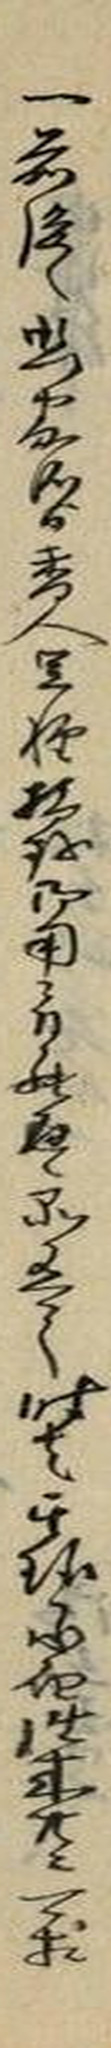一前後之御番所ゟ番人足軽指越御用に付罷通候品有之時は其趣承届往来共に可相
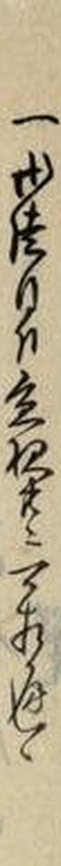一御徒目付昼夜共に可相通候
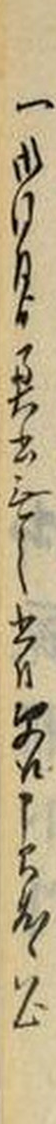一御目付ゟ奥書無之書付受取申間敷候以上
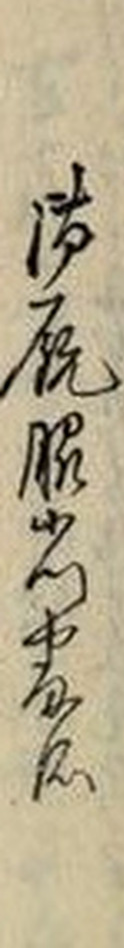御厩脇小門番所
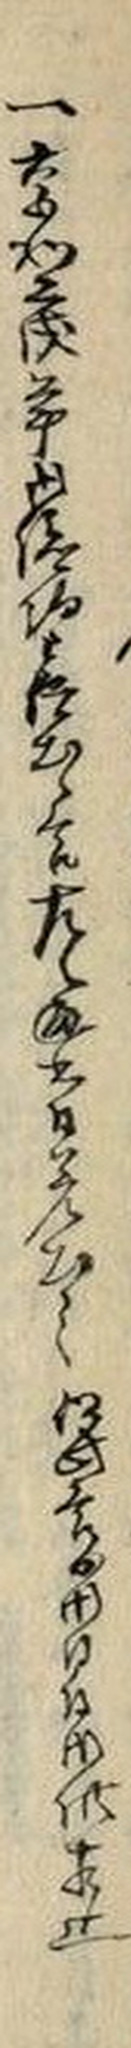一享和二戌年御倹約被仰出候節左之通書付差出之但此節ゟ御目付御供相止
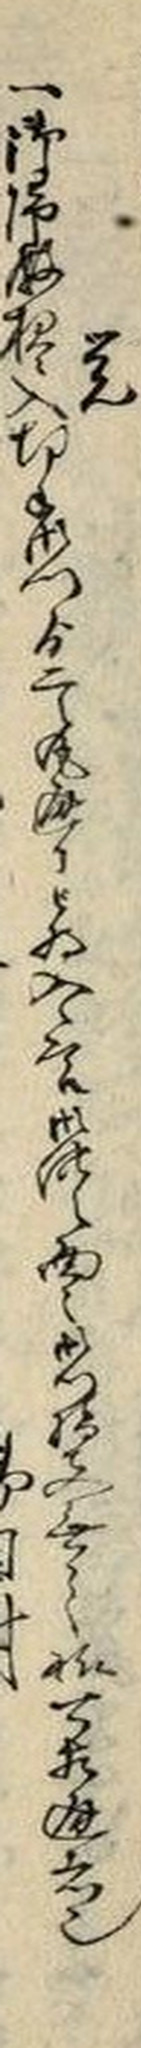一御帰殿夜に入切手御門ゟ二之丸通り被為入候節御供之面々御門指支無之様可相通者也
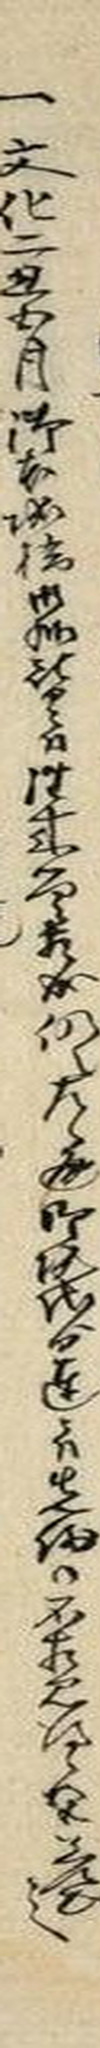一文化二丑五月御本城橋御掛替候に付往来留に相成仍之左之通御城代ゟ達候付先例は不相見候得共差出之
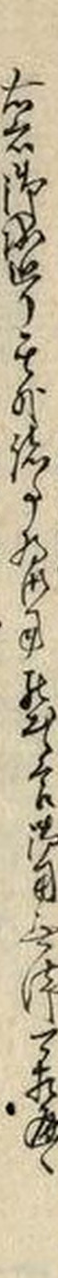右者御城廻り其外諸事為御用罷出候節は御用無滞可相通候
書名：御門御櫓之部
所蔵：福井県文書館 Fukui Prefectural Archives
